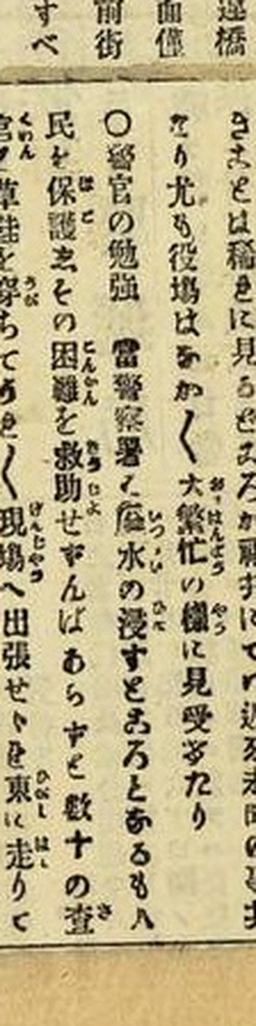○警官の勉強当警察署は溢水の浸すところとなるも人
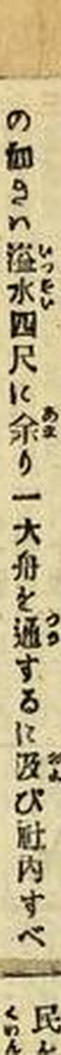の如きは溢水四尺に余り一大舟を通するに及び社内すべ
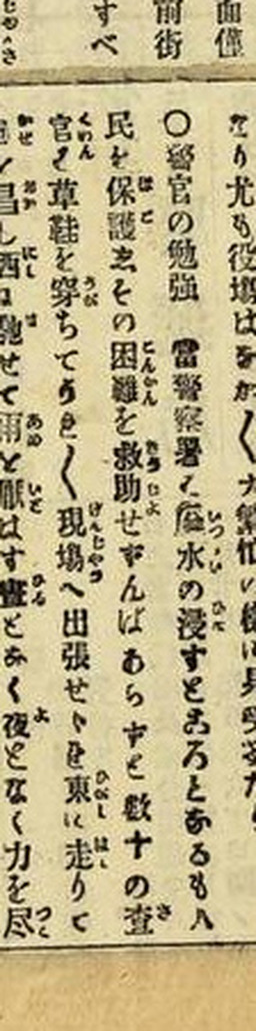民を保護しその困難を救助せずんばあらずと数十の査
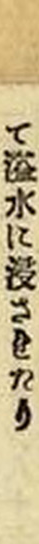て溢水に浸されたり
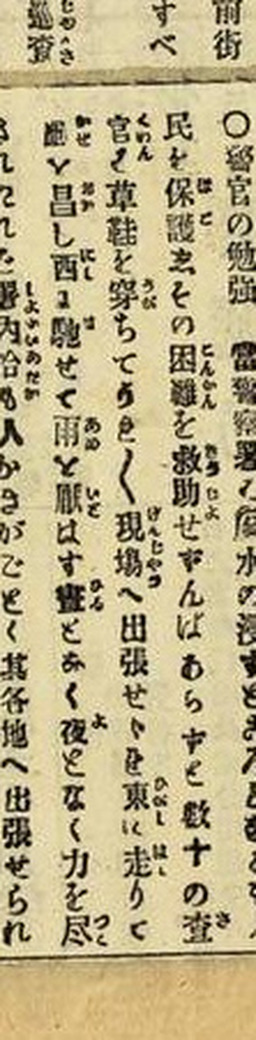官は草鞋を穿ちてかれ〳〵現場へ出張せられ東に走りて
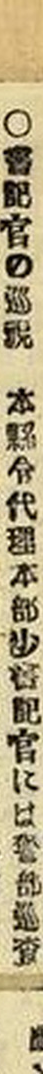○書記官の巡視本県令代理本部少書記官には警部巡査
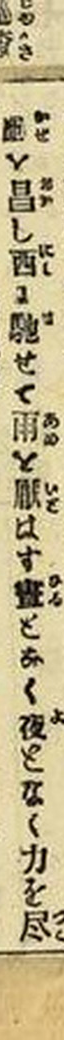風を冒し西に馳せて雨を厭はず昼となく夜となく力を尽
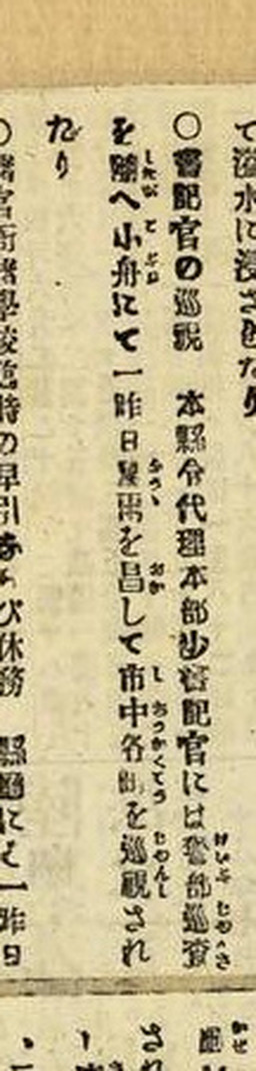を随へ小舟にて一昨日風雨を冒して市中各町を巡視され
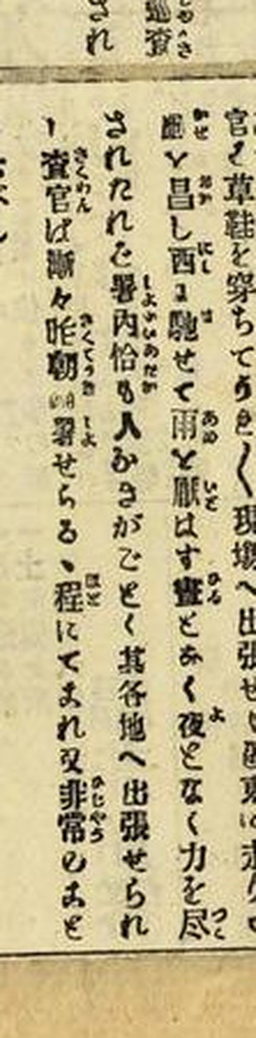されたれば署内恰も人なきがごとく其各地へ出張せられ
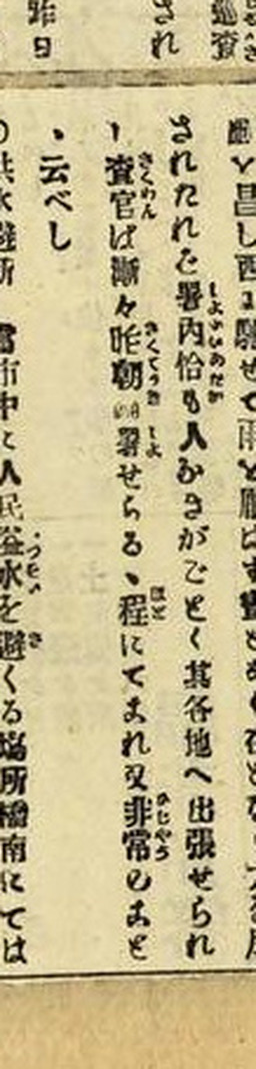し査官は漸々昨朝帰署せらるゝ程にてこれ又非常のこと
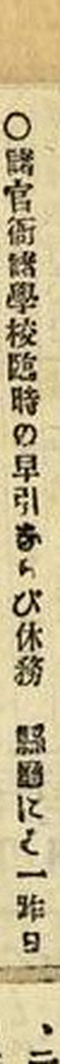○諸官衙諸学校臨時の早引ならび休務県庁には一昨日
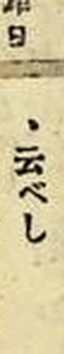ゝ云べし
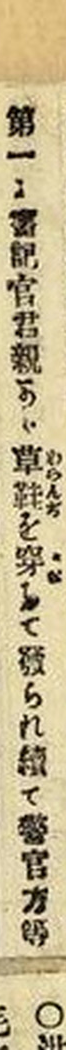第一に書記官君親より草鞋を穿ちて発られ続て警官方等
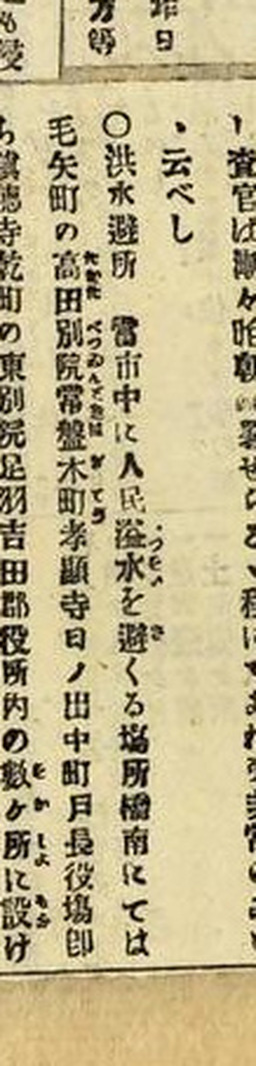○洪水避所当市中に人民溢水を避くる場所橋南にては
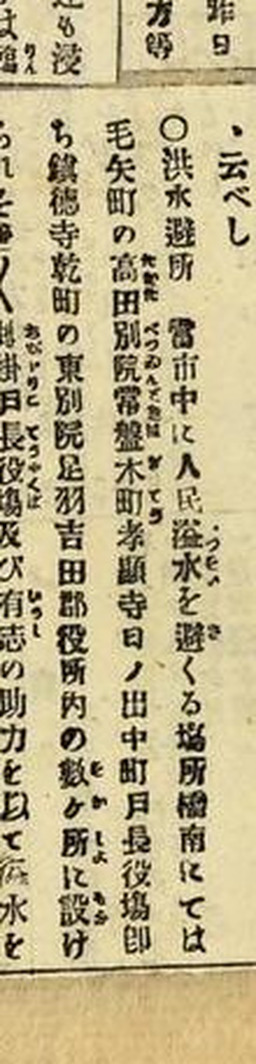毛矢町の高田別院常盤木町孝顕寺日ノ出中町戸長役場即
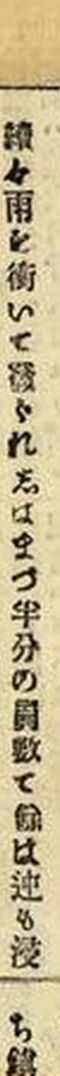続々雨を衝いて発られしはまづ半分の員数て余は迚も浸
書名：温古集 五巻
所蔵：福井県文書館 Fukui Prefectural Archives
